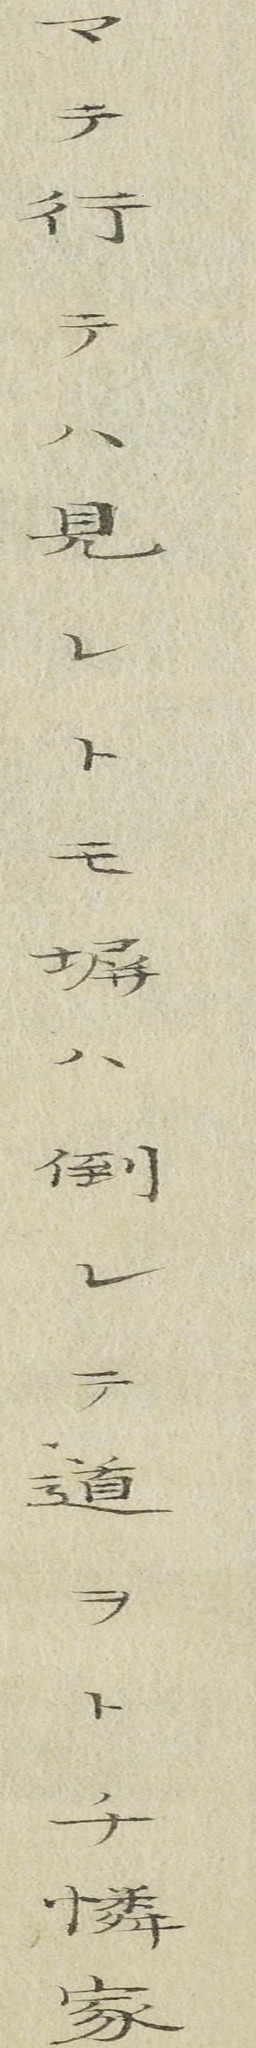マテ行テハ見レトモ塀ハ倒レテ道ヲトチ隣家
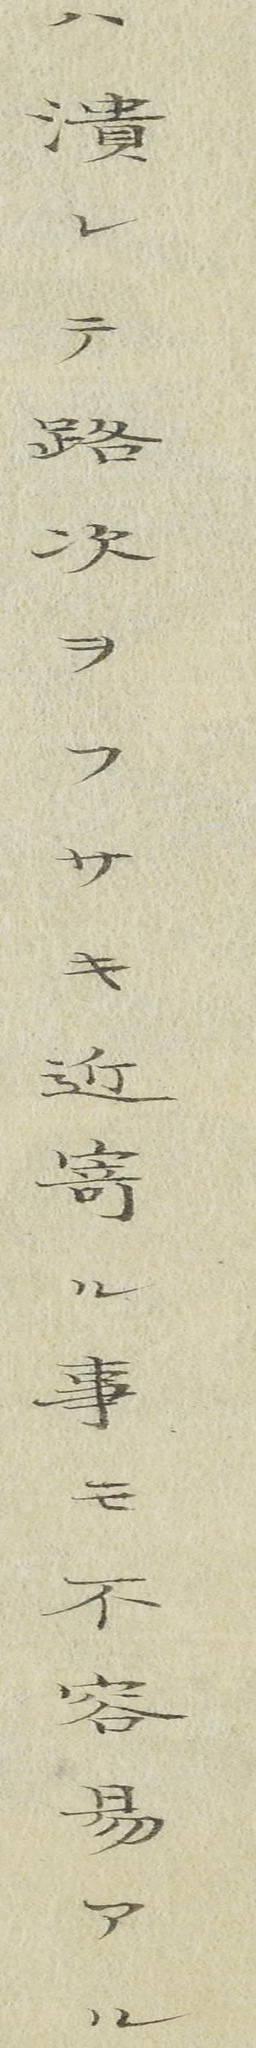ハ潰レテ路次ヲフサキ近寄ル事モ不容易アル
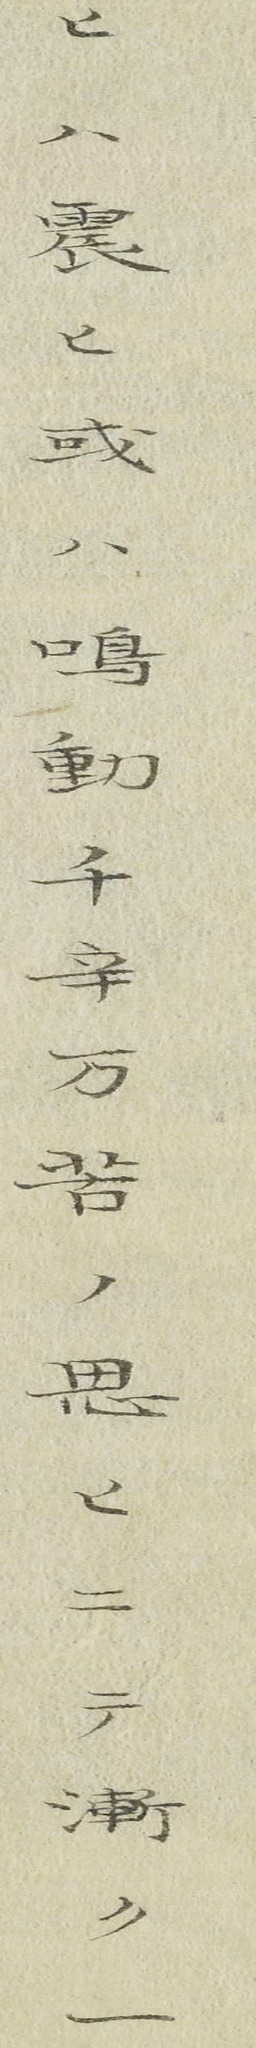ヒハ震ヒ或ハ鳴動千辛万苦ノ思ヒニテ漸ク一
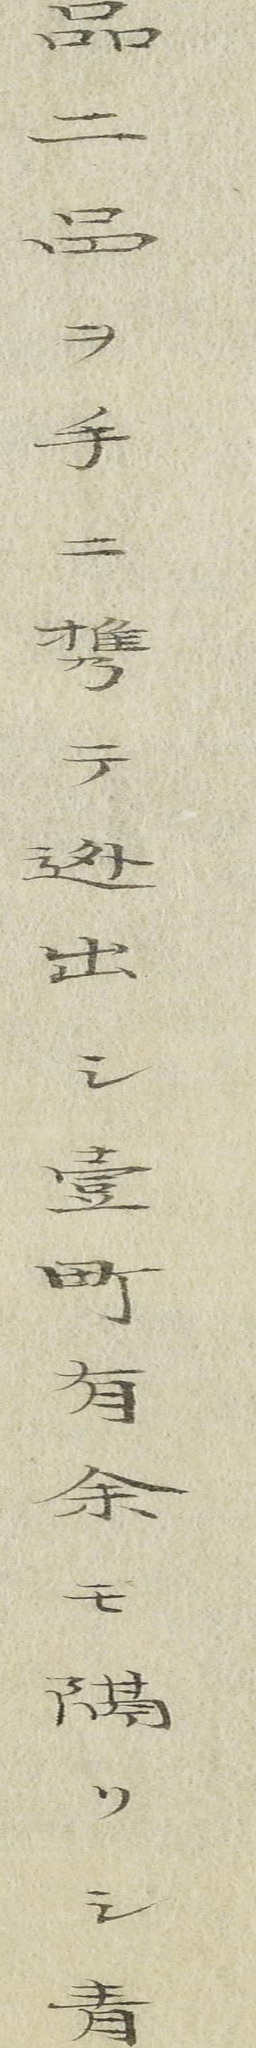品二品ヲ手ニ携テ迯出シ壹町有余モ隔リシ青
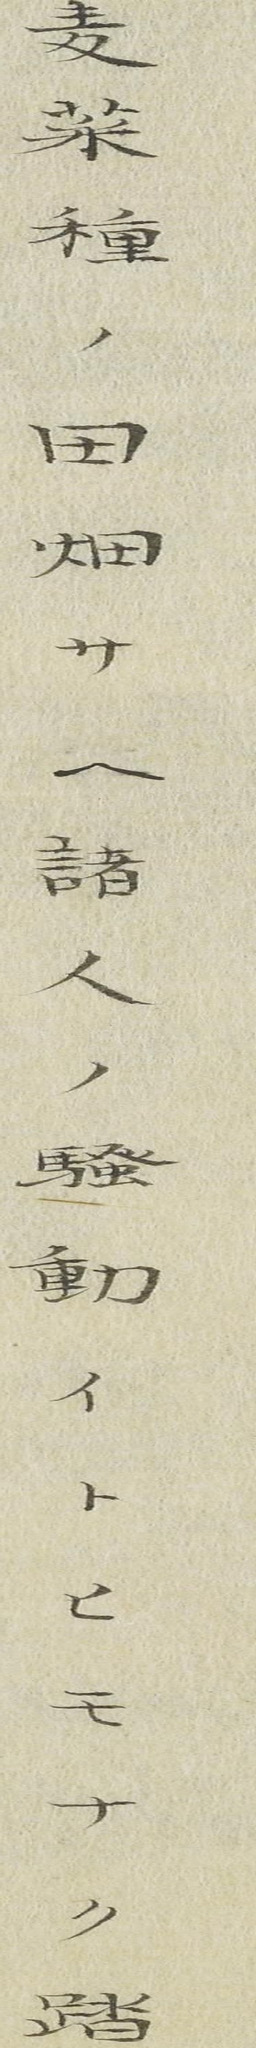麦菜種ノ田畑サヘ諸人ノ騒動イトヒモナク踏
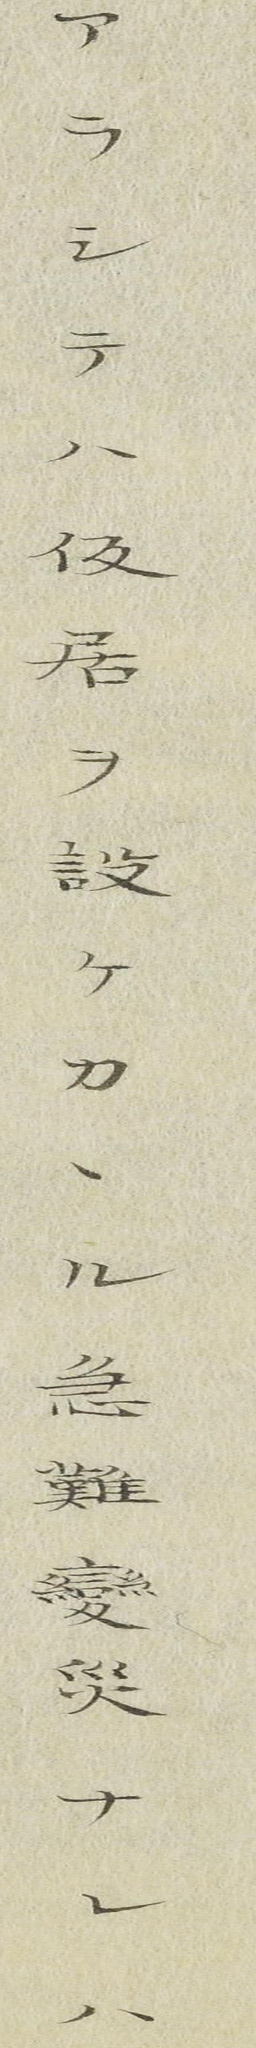アラシテハ仮居ヲ設ケカヽル急難変災ナレハ
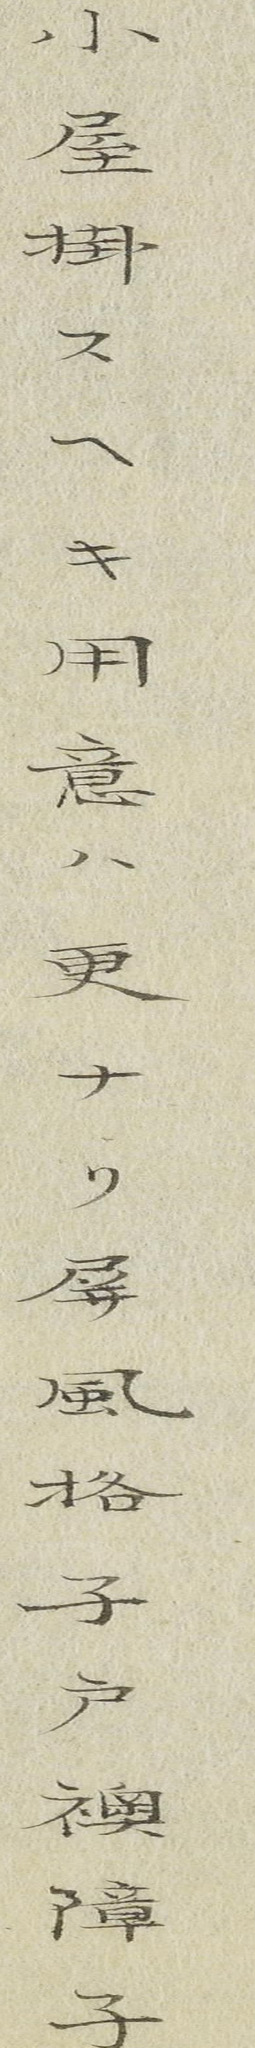小屋掛スヘキ用意ハ更ナリ屏風格子戸襖障子
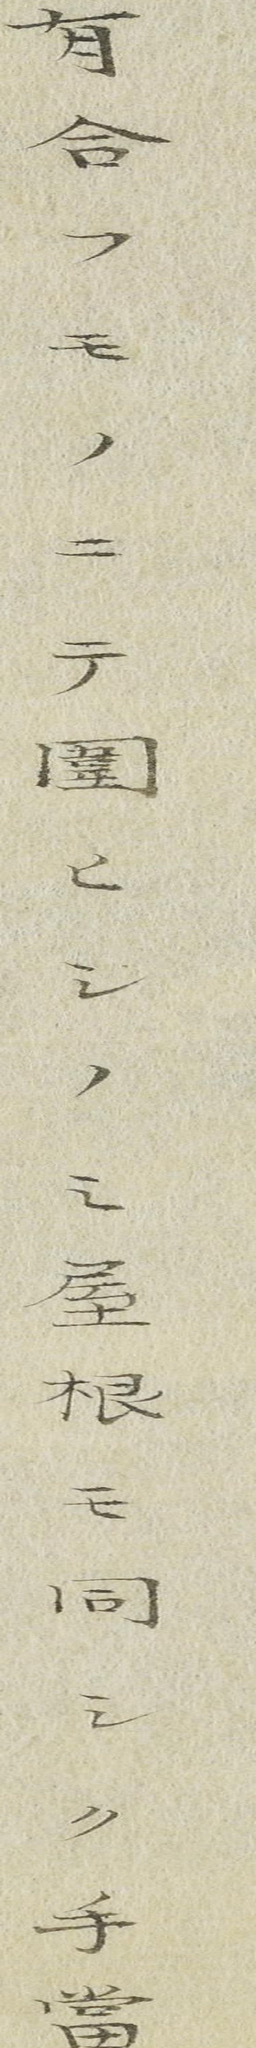有合フモノニテ囲ヒシノミ屋根モ同シク手当
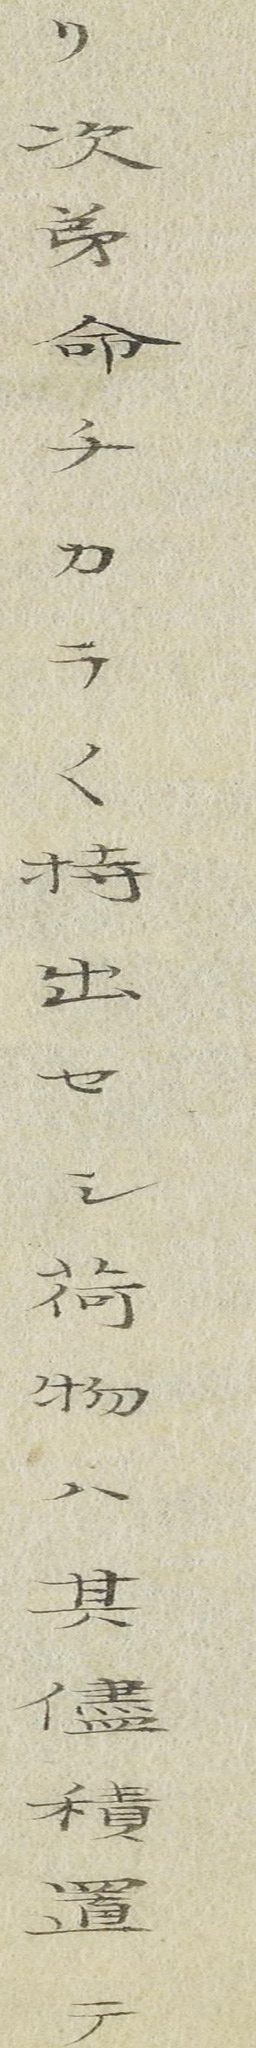リ次第命チカラ〱持出セシ荷物ハ其侭積置テ
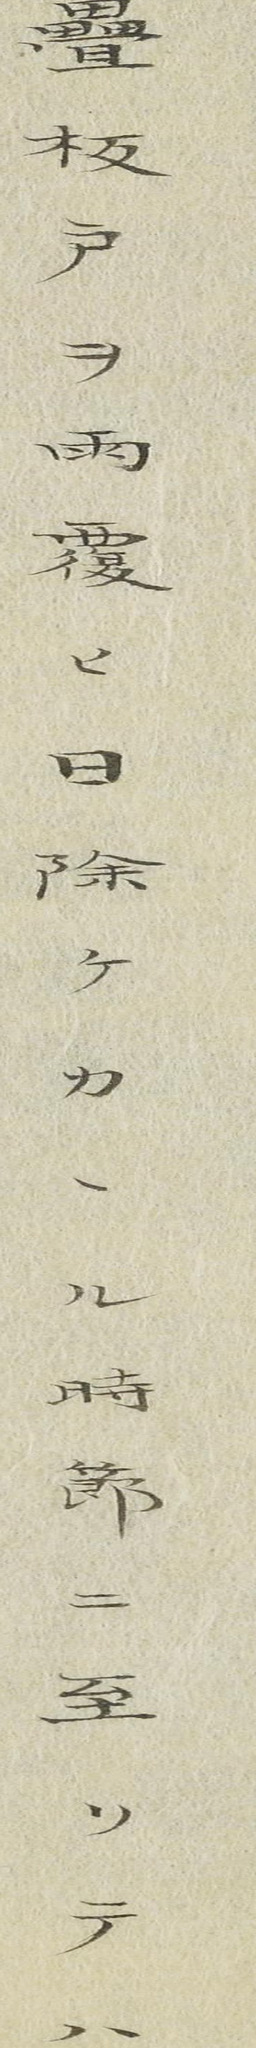畳板戸ヲ雨覆ヒ火除ケカヽル時節ニ至リテハ
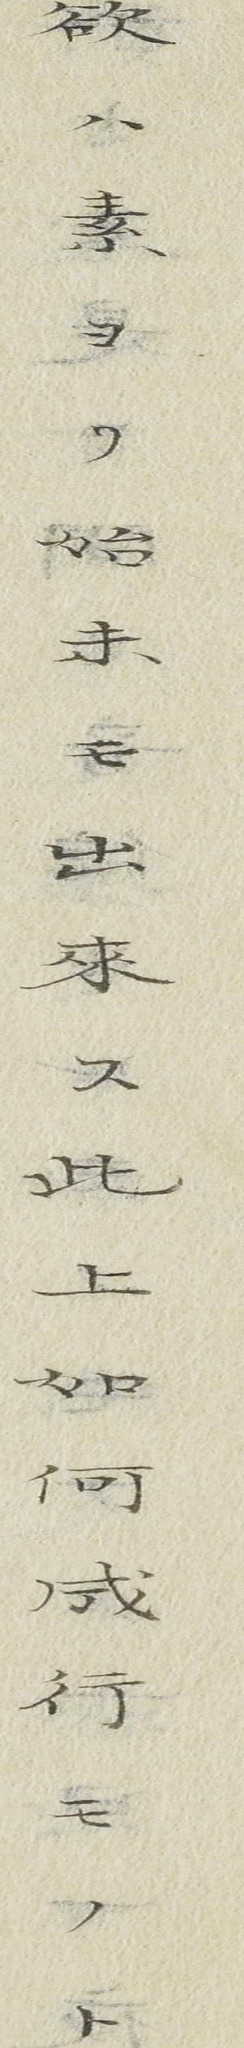欲ハ素ヨリ始末モ出来ス此上如何成行モノト
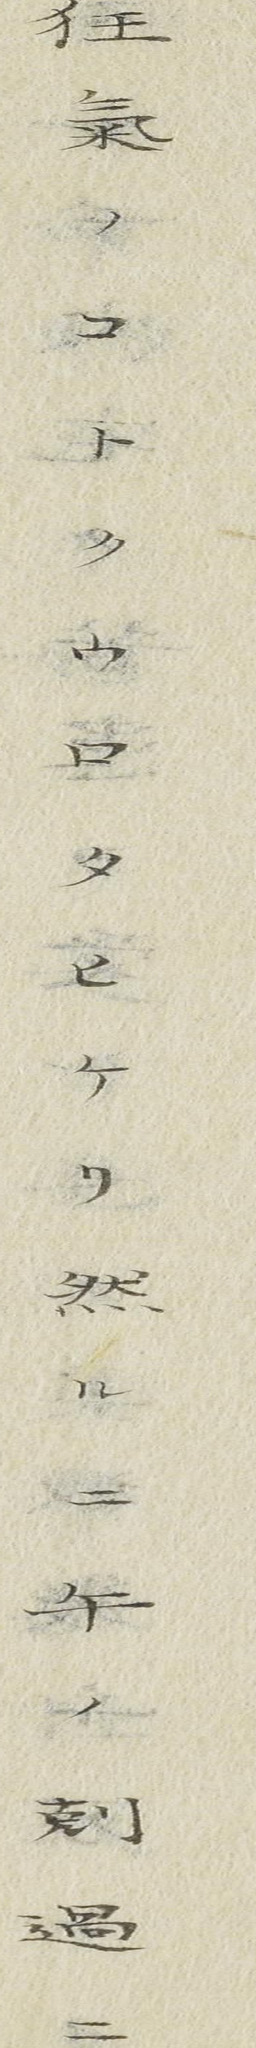狂気ノコトクウロタヒケリ然ルニ午ノ刻過ニ
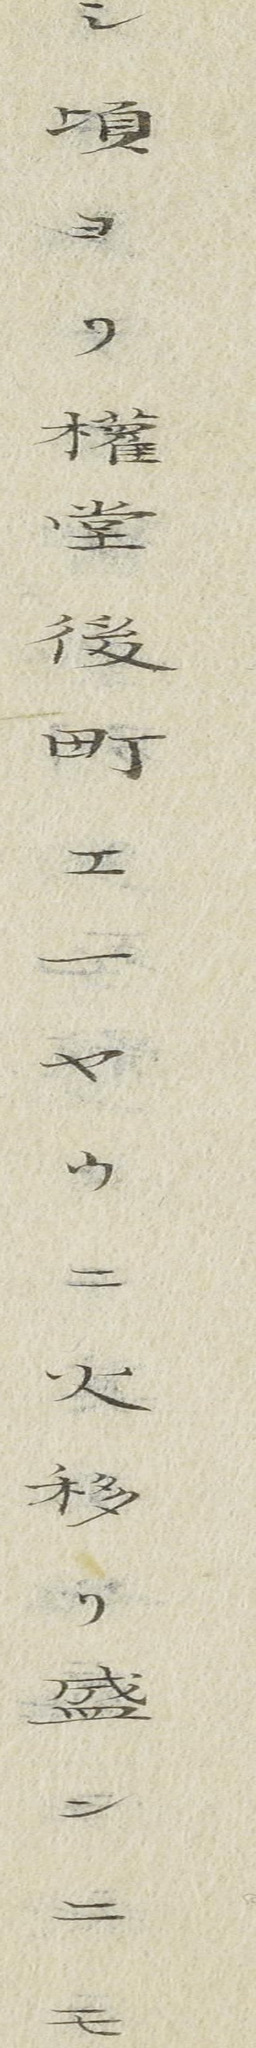シ頃ヨリ権堂後町エ一ヤウニ火移リ盛ンニモ
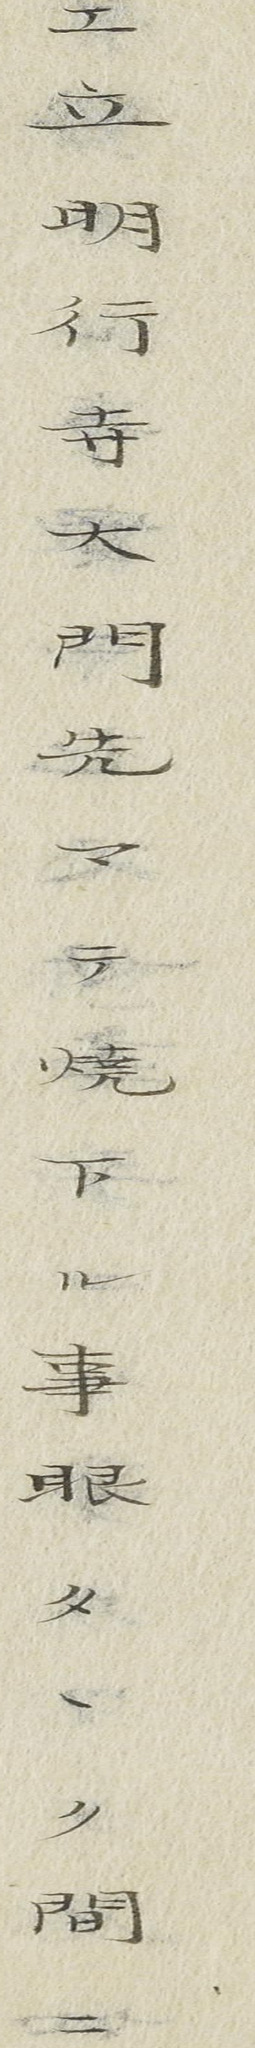エ立明行寺大門先マテ焼下ル事眼タヽク間ニ
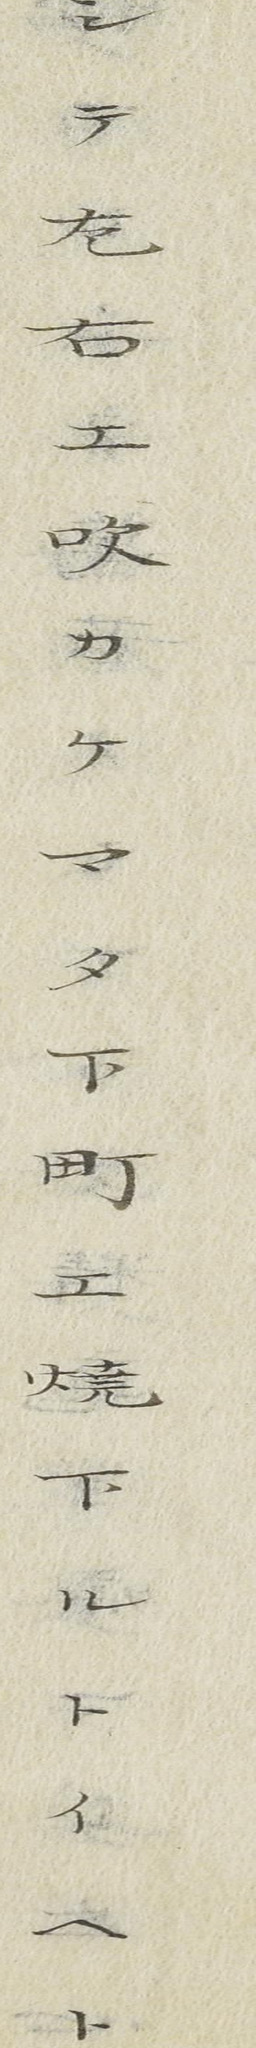シテ左右エ吹カケマタ下町エ焼下ルトイヘト
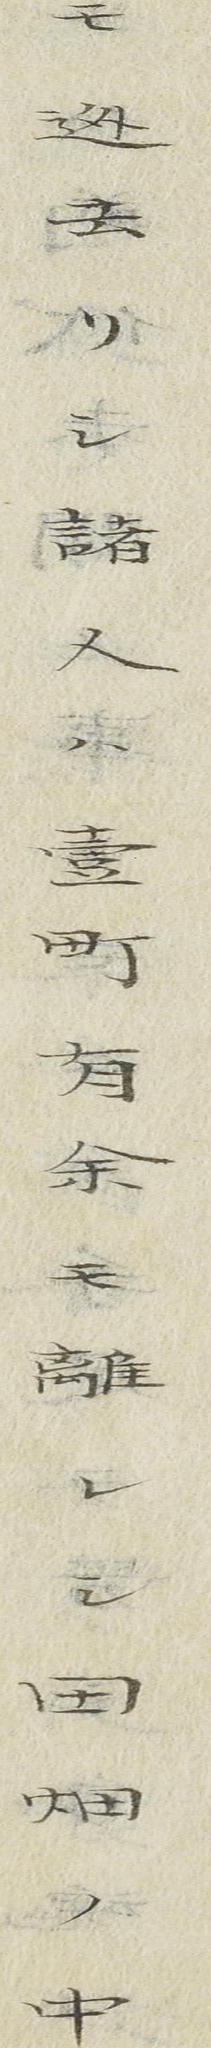モ迯去リシ諸人ハ壹町有余モ離レシ田畑ノ中
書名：地災撮要　地震之部　巻ノ二
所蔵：東京大学地震研究所図書室 Earthquake Research Institute Library, The University of Tokyo, JAPAN
